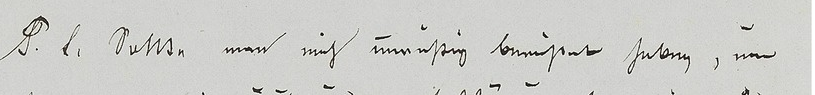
P. S. Sollte man mich unrichtig berichtet haben, um
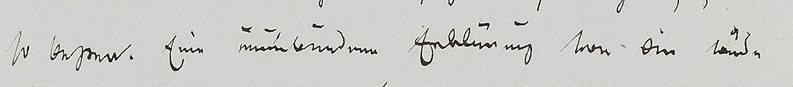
so beßer. Eine unumwundene Erklärung von dir würde
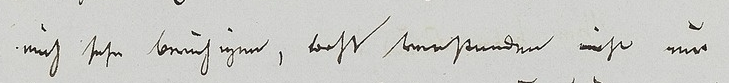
mich sehr beruhigen, wohl verstanden nicht nur
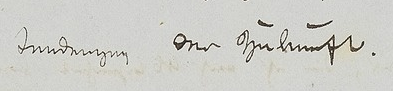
Tendenzen der Zukunft.
